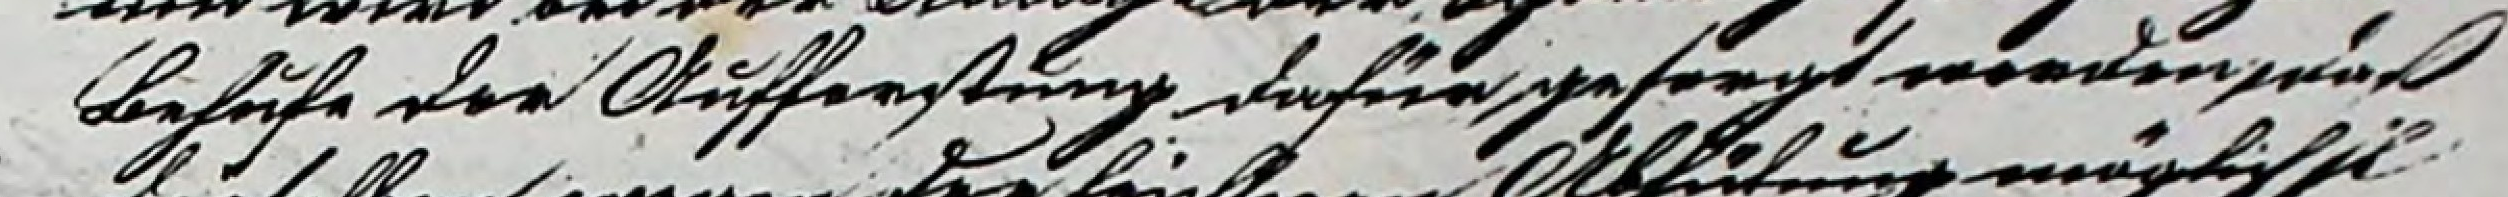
Behufe der Aufferstung dafür gesorgt werden, das
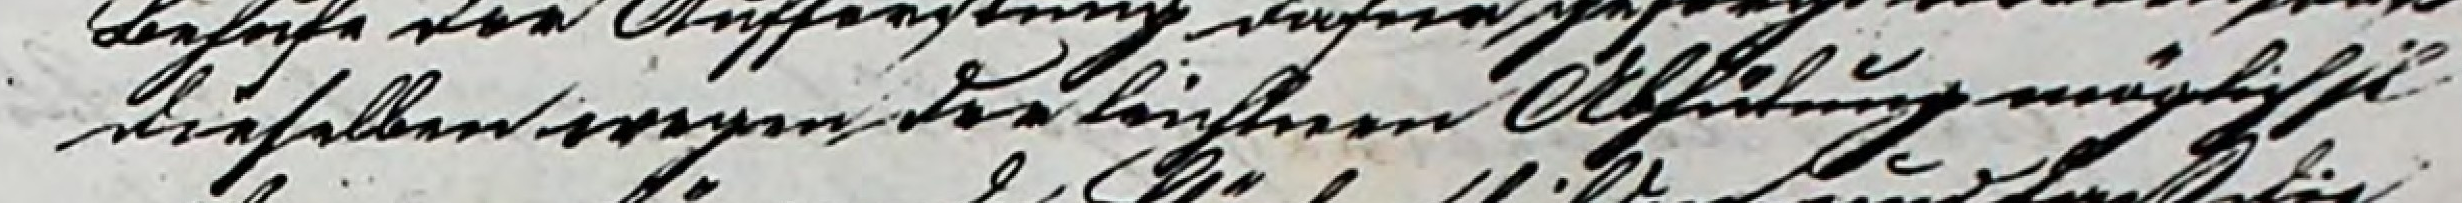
dieselben wegen, den leichtnen Abhütung möglich hl
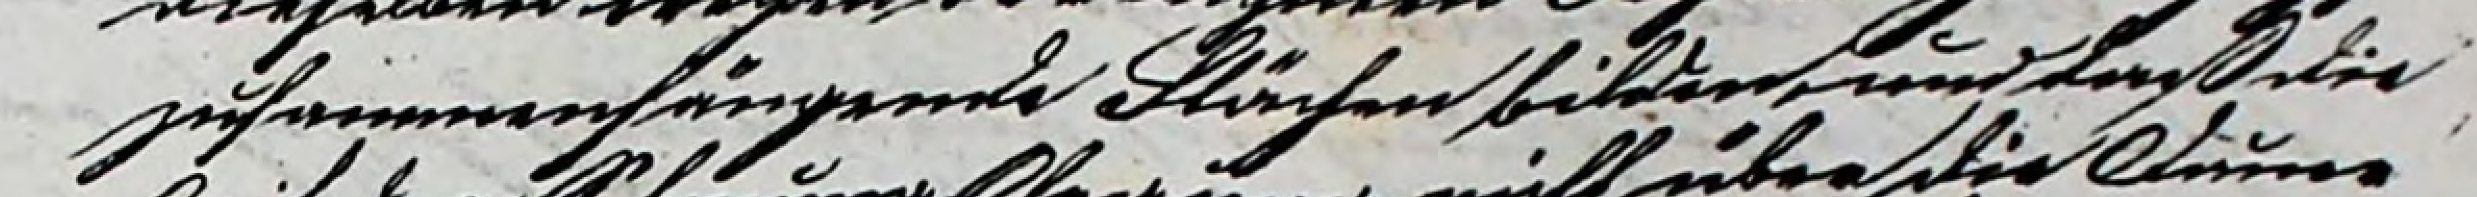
zusammenhängende Flächen bilden, und daß die
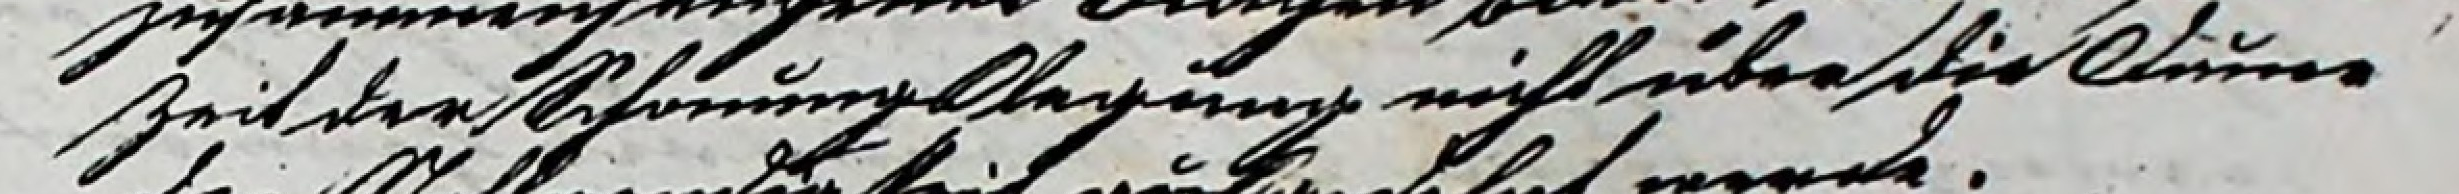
Zeit der Schonungslagung nicht über die Dauer
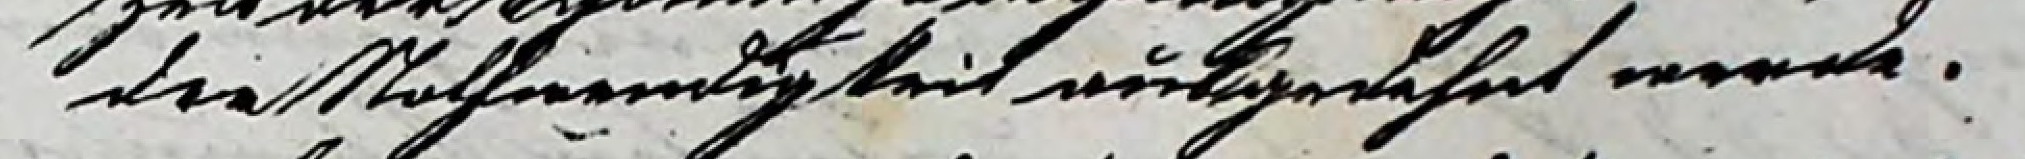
der Nothwendigkeit ausgedehnt werde.
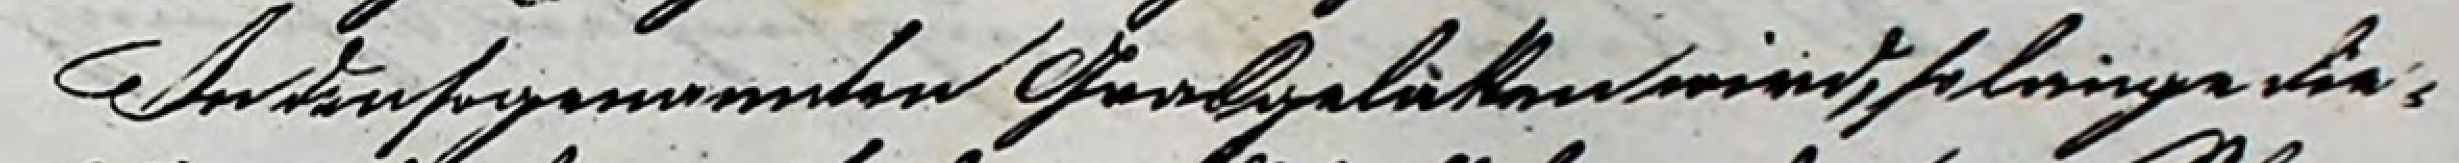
In den sogenannten Grasgeläken wird, so lange die„
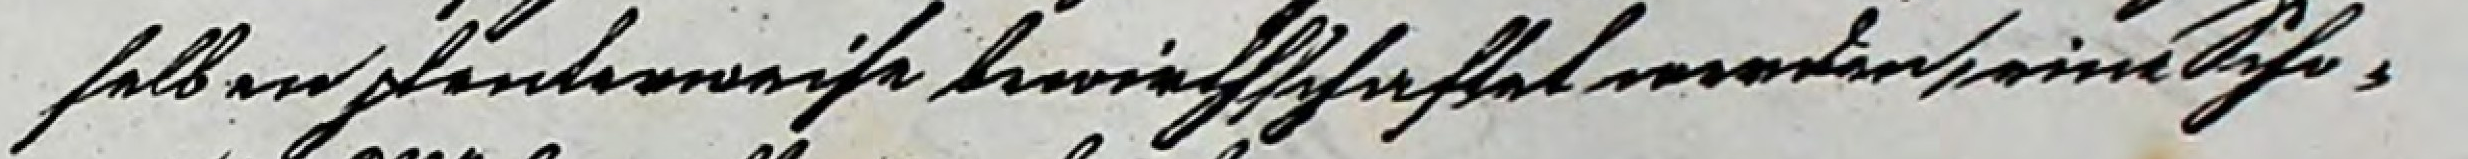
selben plenterweise bewirthschaftet werden, eine Scho„
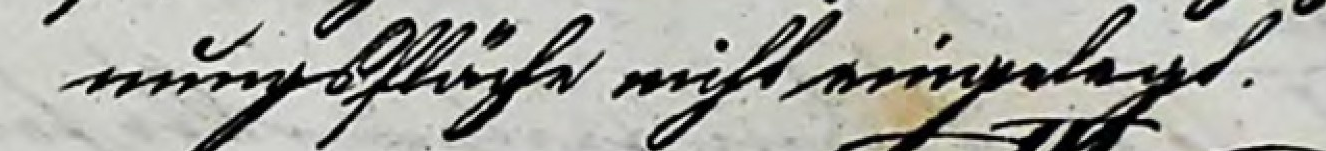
nungsfläche nicht eingelegt.
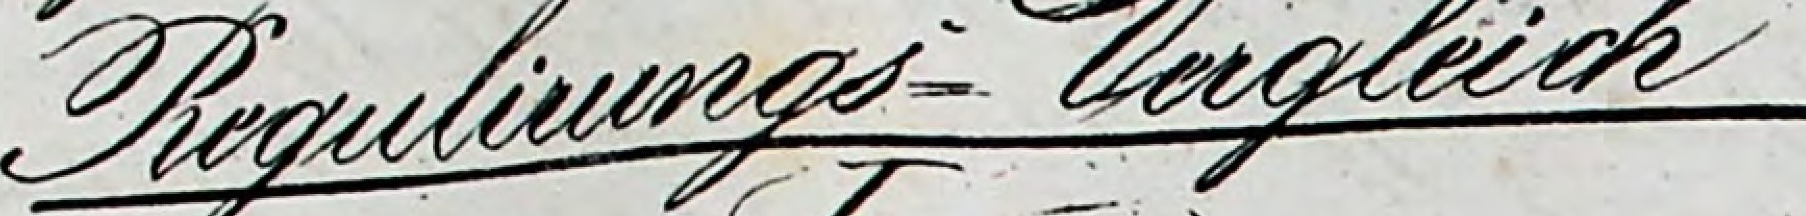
Regulirungs = Vergleich
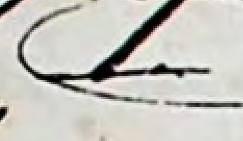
I.
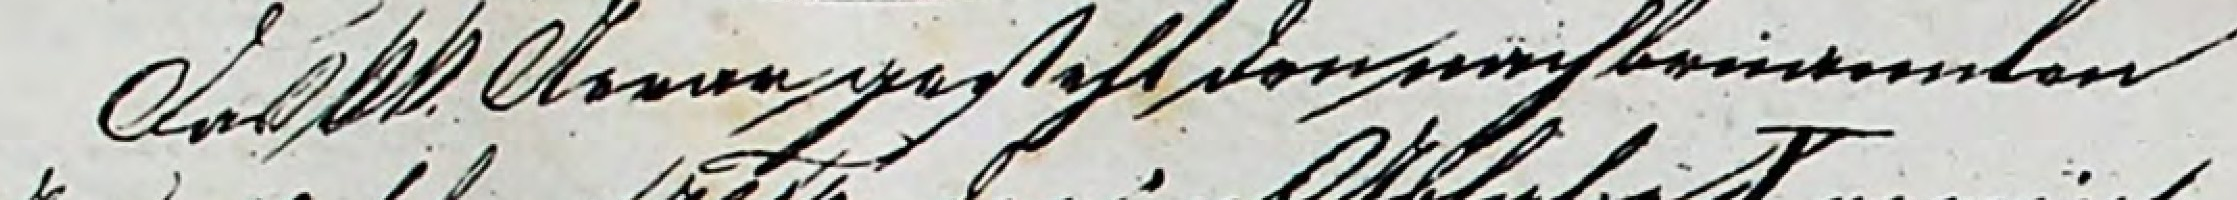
Das kk. Aerar gesteht den nachbenannten
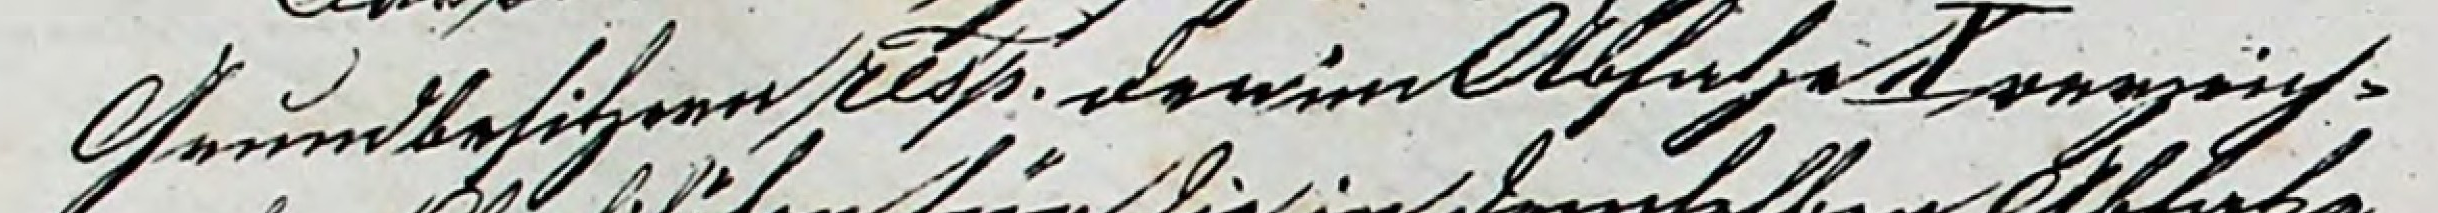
Grundbesitzern resp. den im Absatze X verzeich=
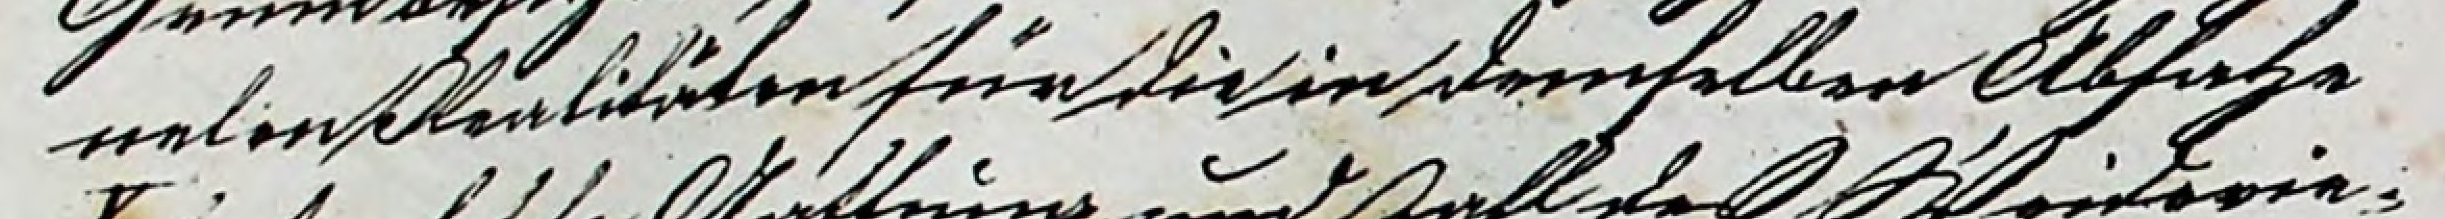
neten Realitäten die in demselben Absatze
